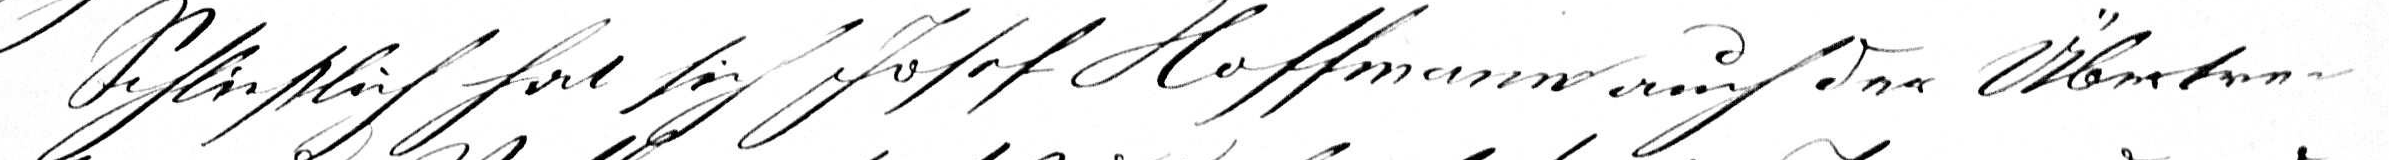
Schließlich hat sich Josef Hoffmann auch der Übertre¬
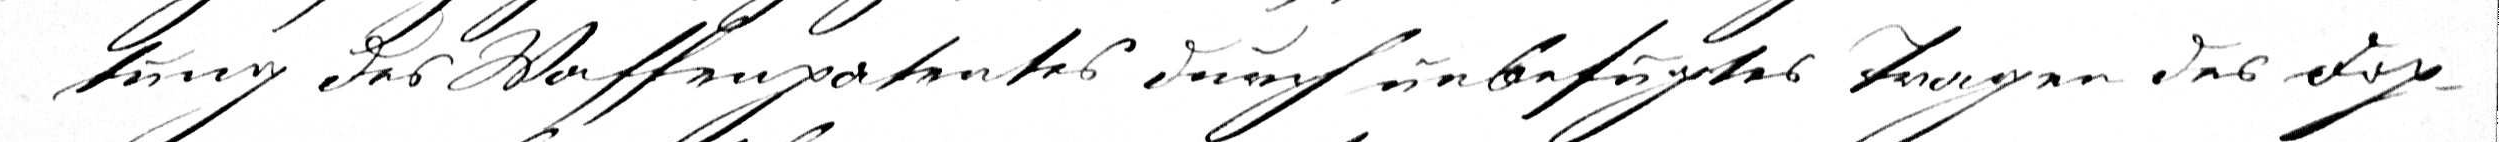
tung des Waffenpatentes durch unbefügtes Tragen des Dop¬
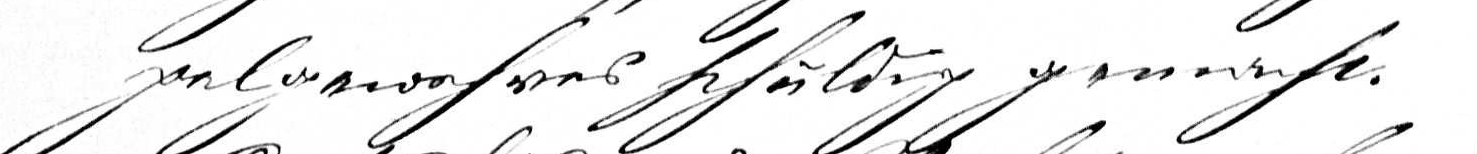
pelgewehres schuldig gemacht.
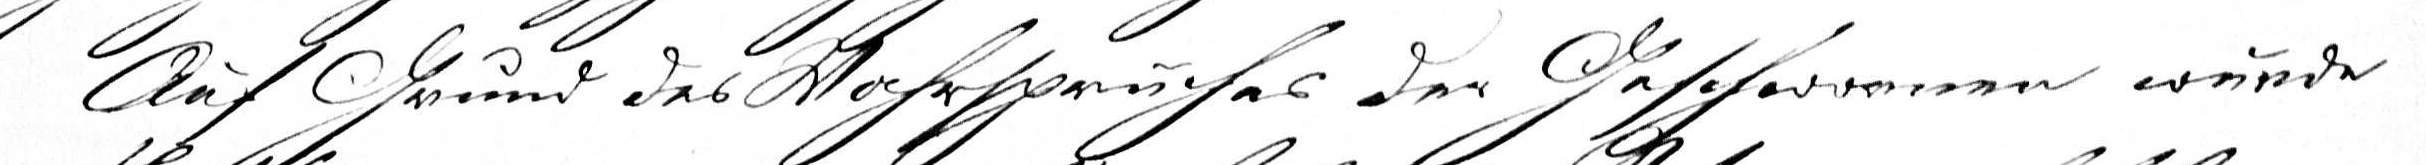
Auf Grund des Wahrspruches der Geschwornen wurde
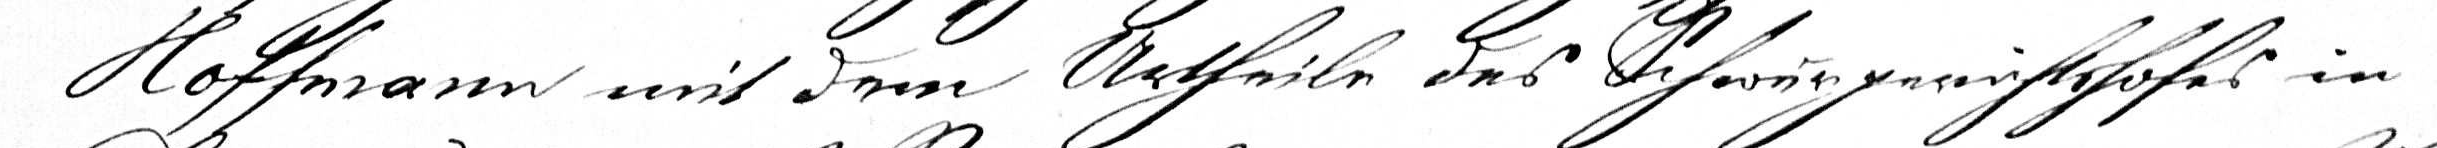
Hoffmann mit dem Urtheile des Schwurgerichtshofes in
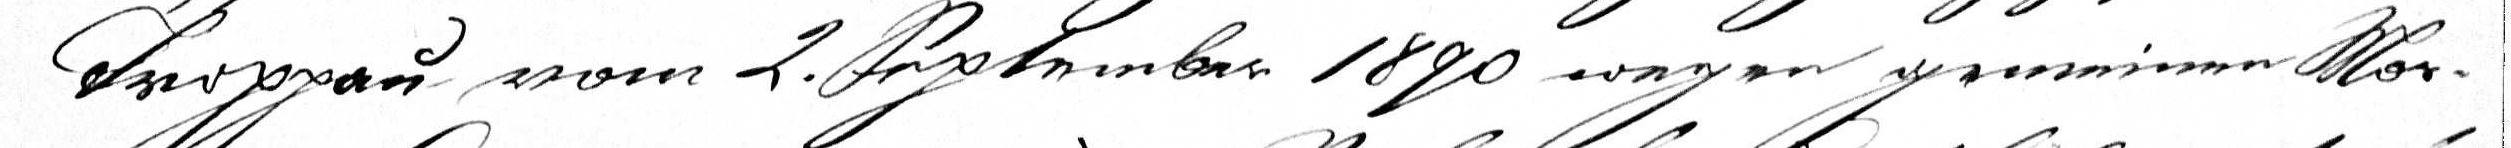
Troppau vom 2. September 1890 wegen gemeinen Mor¬
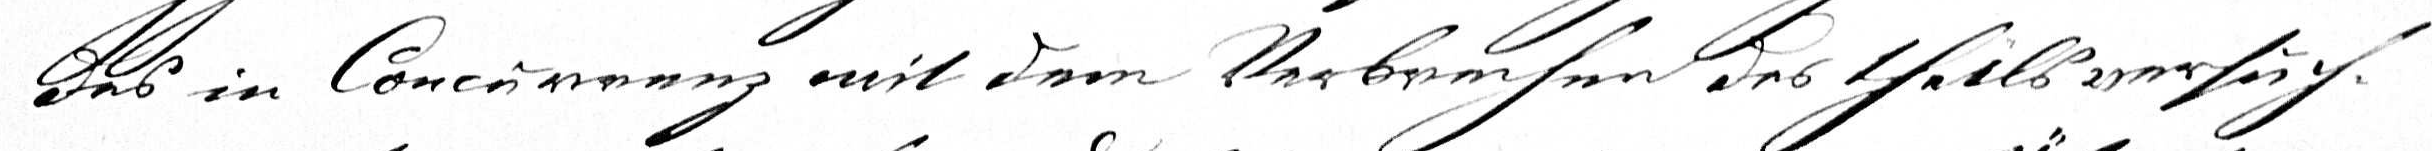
des in Concurrenz mit dem Verbrechen des theilsversuch¬
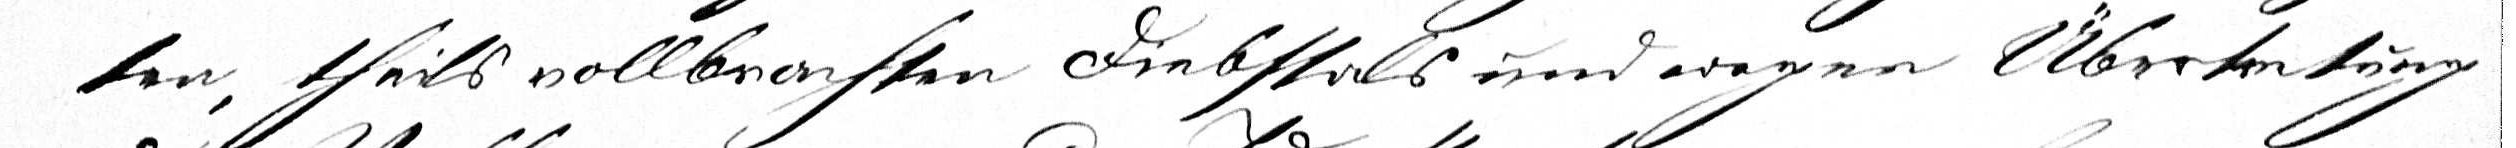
ten, theils vollbrachten Diebstals und wegen Übertretung
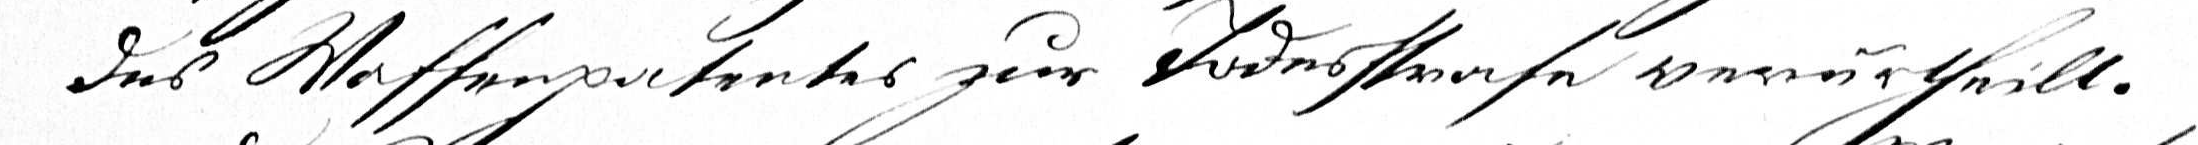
des Waffenpatentes zur Todesstrafe verurtheilt.
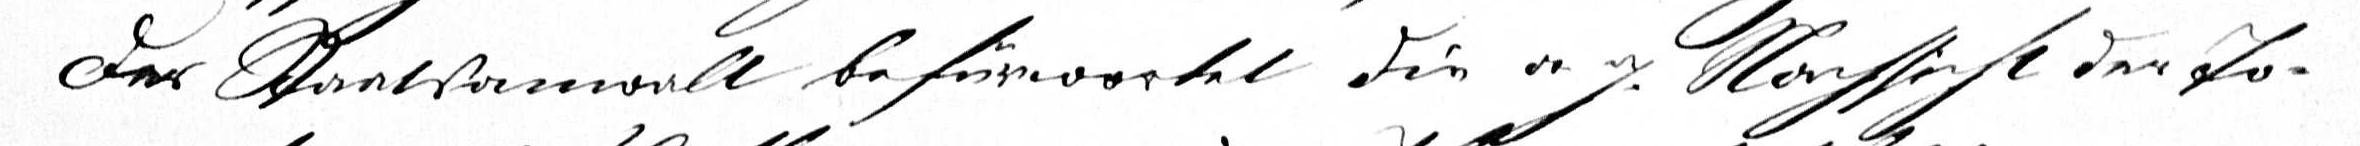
Der Staatsanwalt befürwortet die a g. Nachsicht der To¬
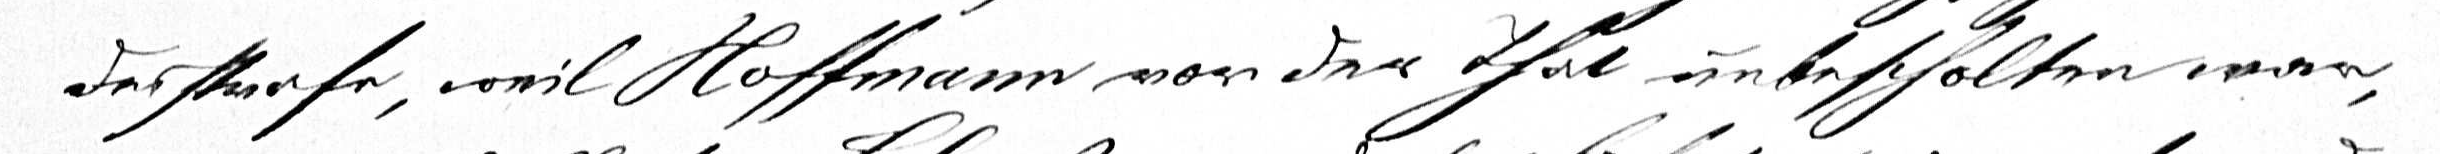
desstrafe, weil Hoffmann vor der That unbescholten war,
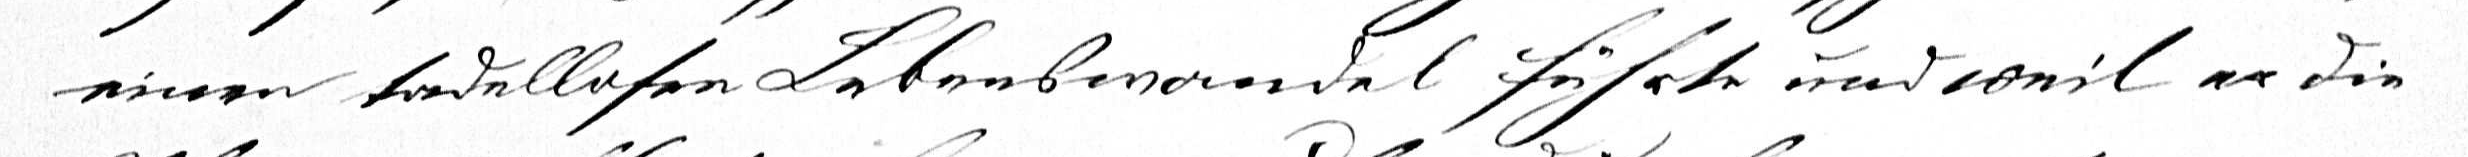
einen tadellosen Lebenswandel führte und weil er die
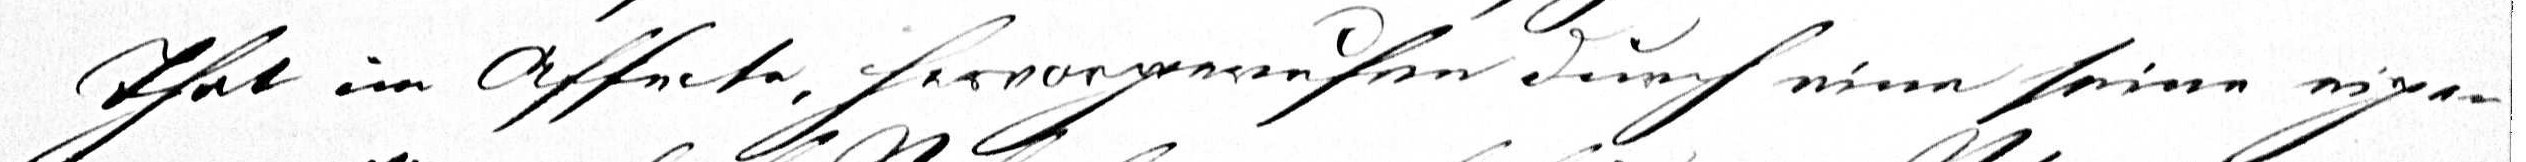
That im Affecte, hervorgerufen durch eine seine eige¬
